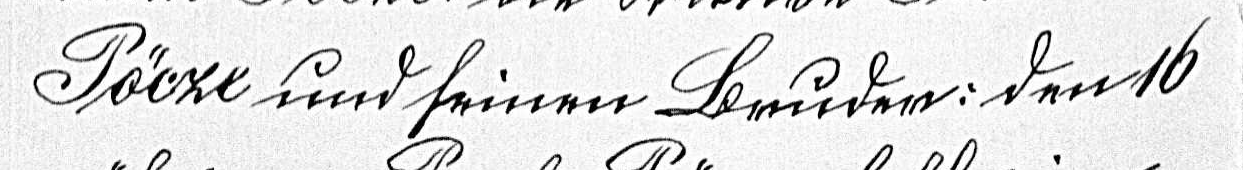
Pöcze und seinen Bruder: den 16
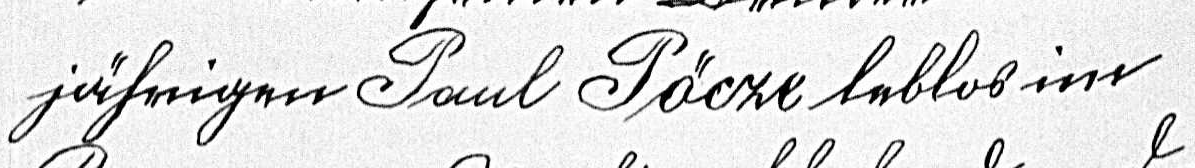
jährigen Paul Pöcze leblos im
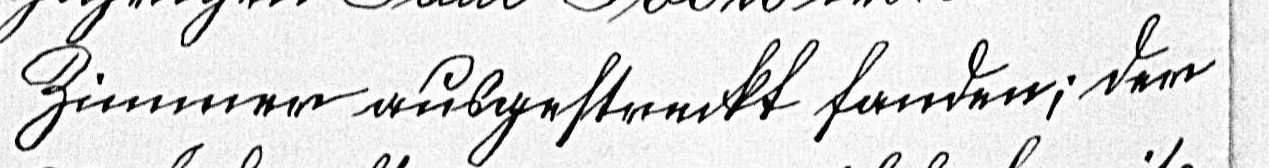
Zimmer ausgestreckt fanden; der
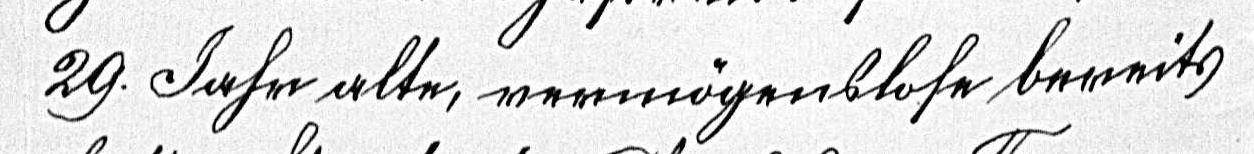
29 Jahr alte, vermögenslose bereits
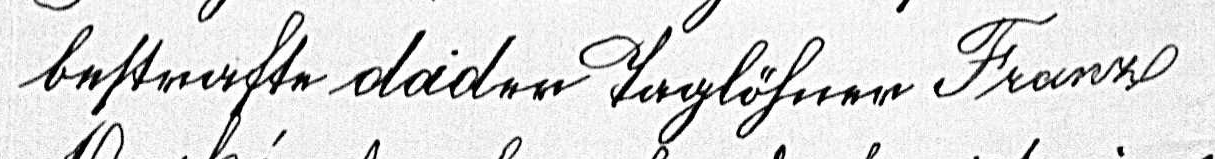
bestrafte dader Taglöhner Franz
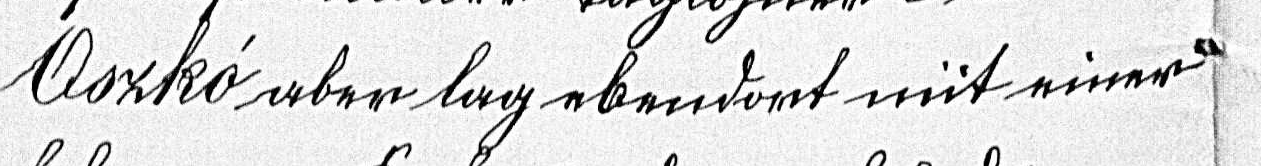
Oszkó aber lag ebendort mit einer
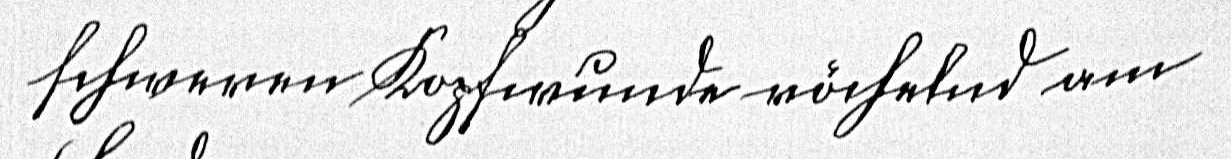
schweren Kopfwunde röchelnd am
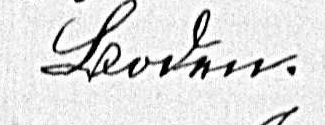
Boden.
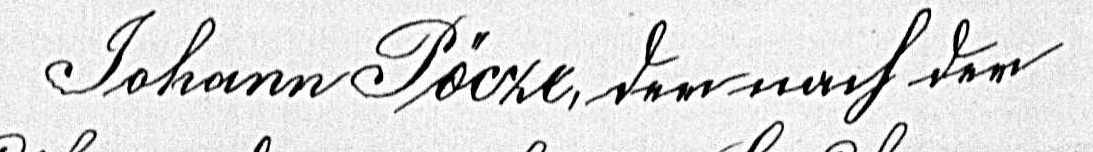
Johann Pöcze, der nach der
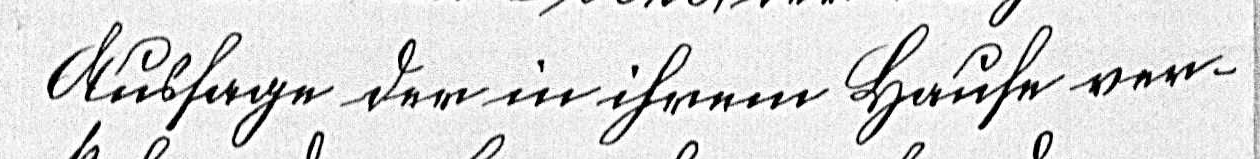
Aussage der in ihren Hause ver¬
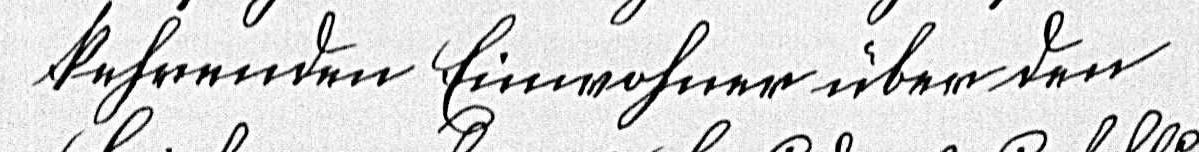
kehrenden Einwohner über den
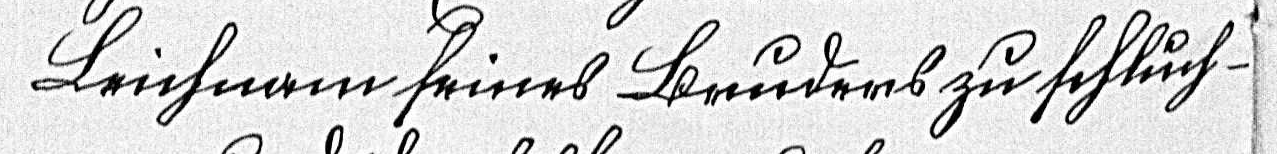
Leichnam seines Bruders zu schluch¬
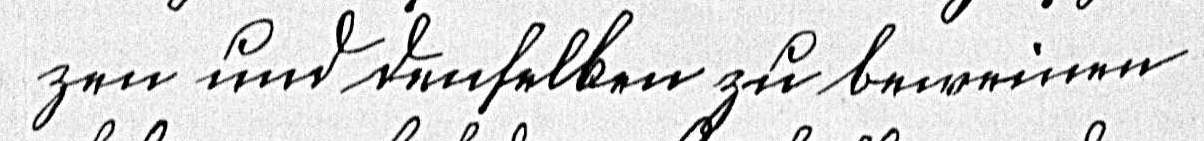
zen und denselben zu beweinen
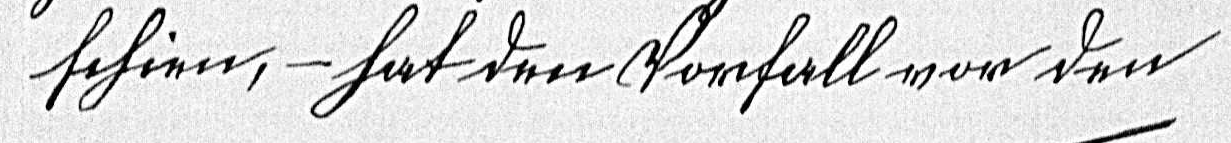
schien, -- hat den Vorfall vor den
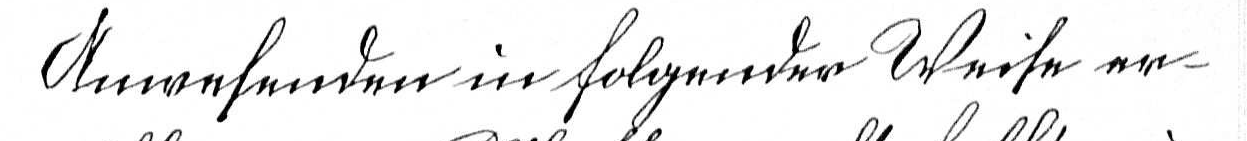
Anwesenden in folgender Weise er¬
